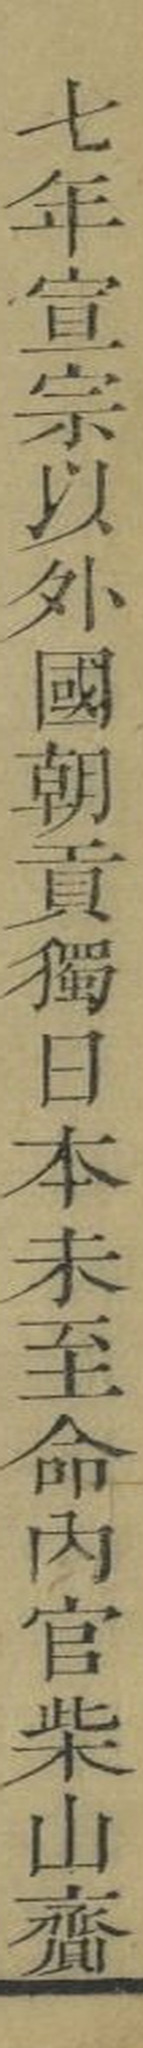七年宣宗以外国朝貢独日本未至命内官柴山齎
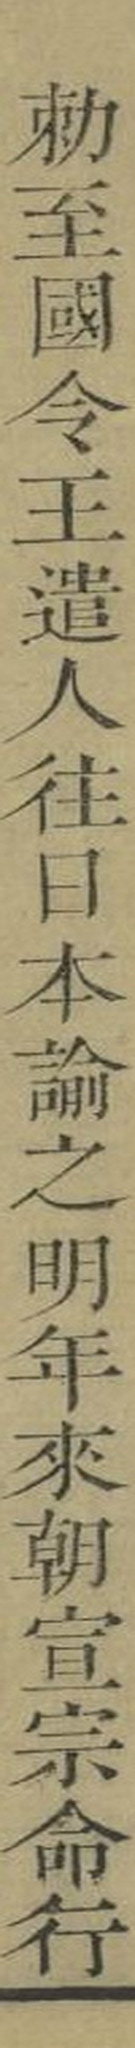勅至国令王遣人往日本諭之明年来朝宣宗命行
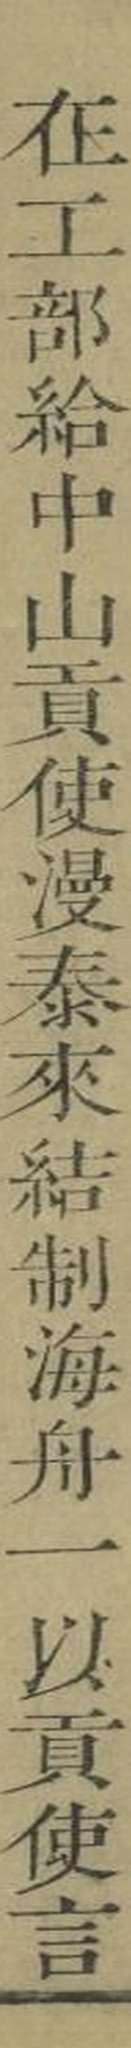在工部給中山貢使漫泰来結制海舟一以貢使言
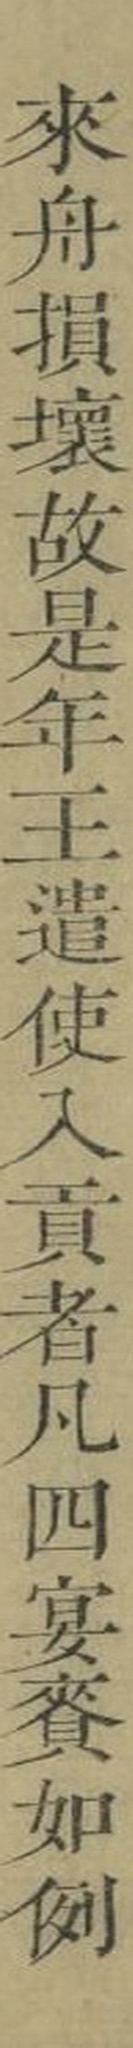来舟損壊故是年王遣使入貢者凡四宴賚如例
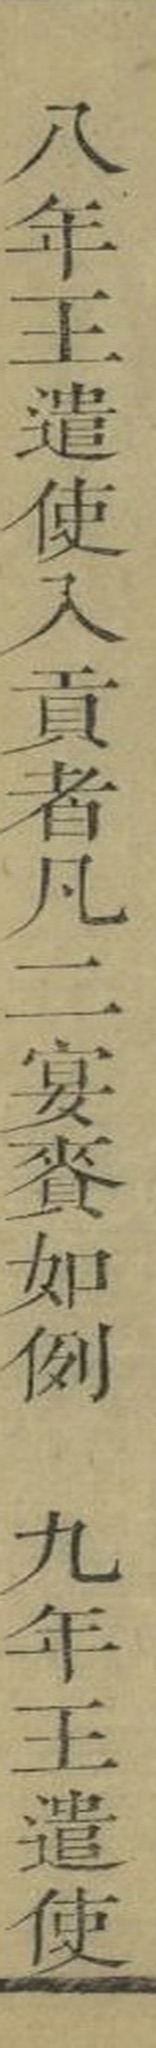八年王遣使入貢者凡二宴賚如例九年王遣使
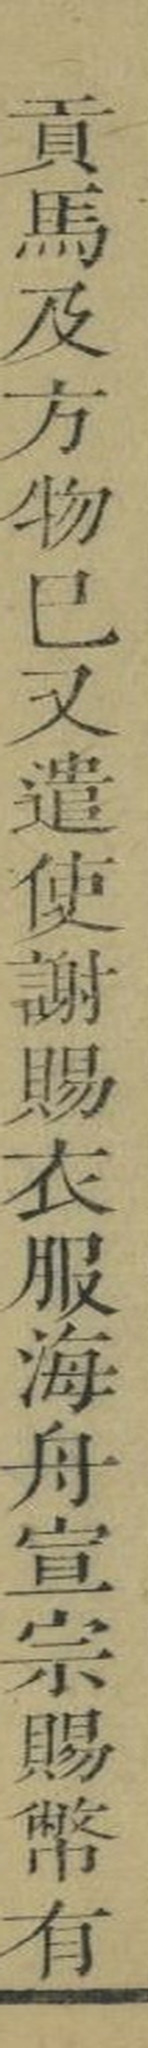貢馬及方物巳又遣使謝賜衣服海舟宣宗賜幣有
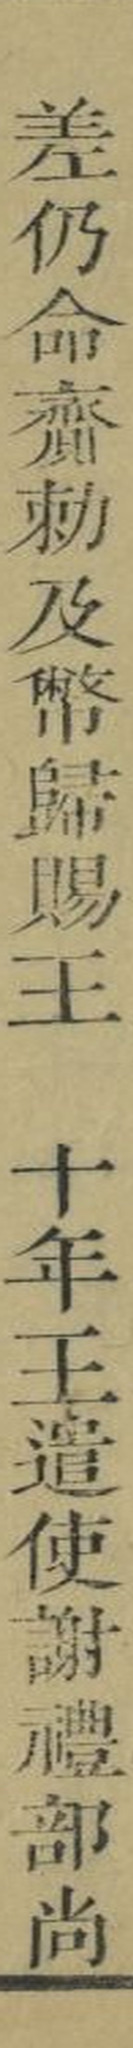差仍命齎勅及幣帰賜王十年王遣使謝礼部尚
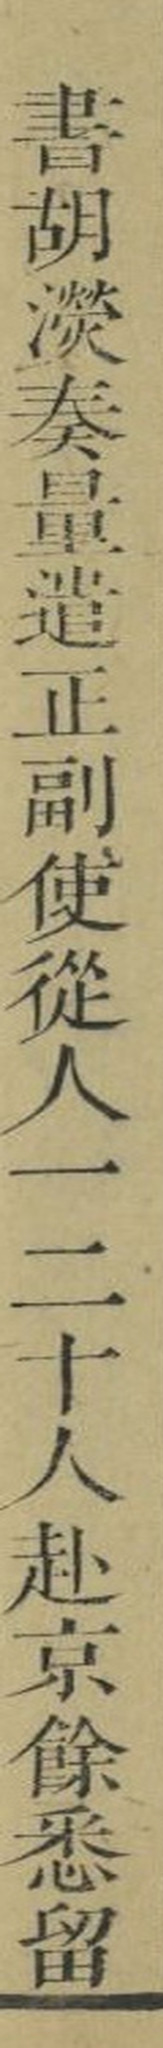書胡濙奏量遣正副使従人一二十人赴京余悉留
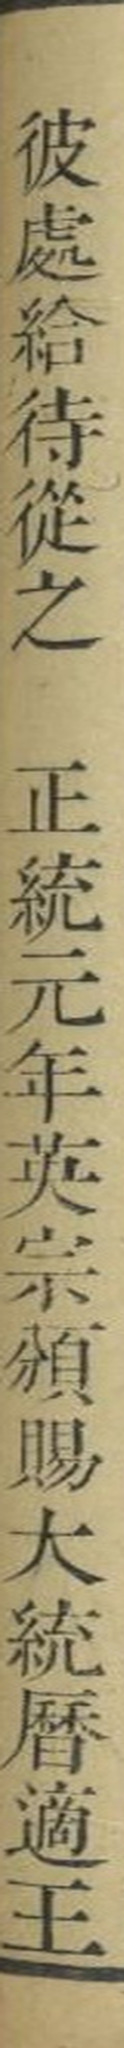彼処給待従之正統元年英宗頒賜大統暦適王
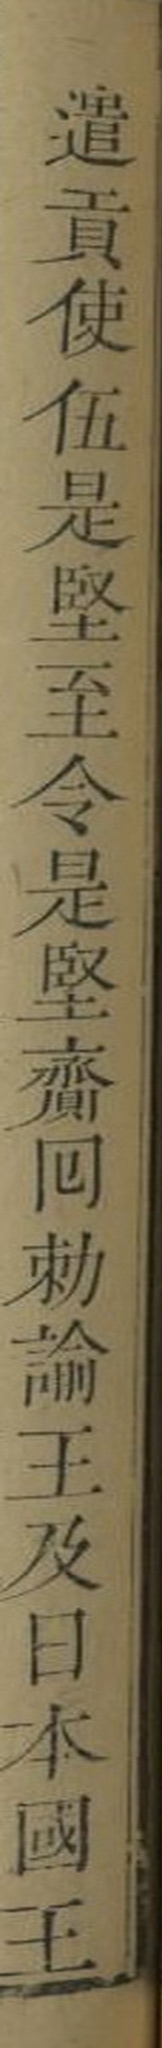遣貢使伍是堅至令是堅齎回勅諭王及日本国王
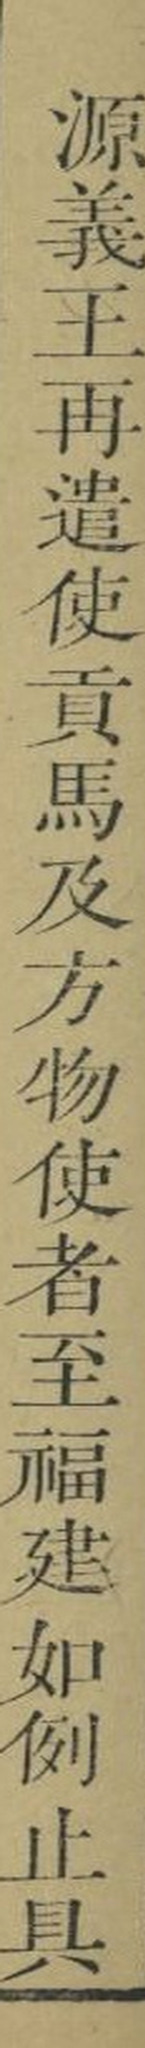源義王再遣使貢馬及方物使者至福建如例止具
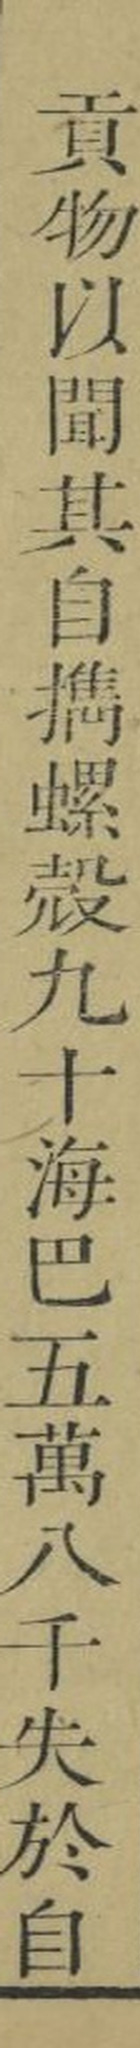貢物以聞其自携螺殻九十海巴五万八千失於自
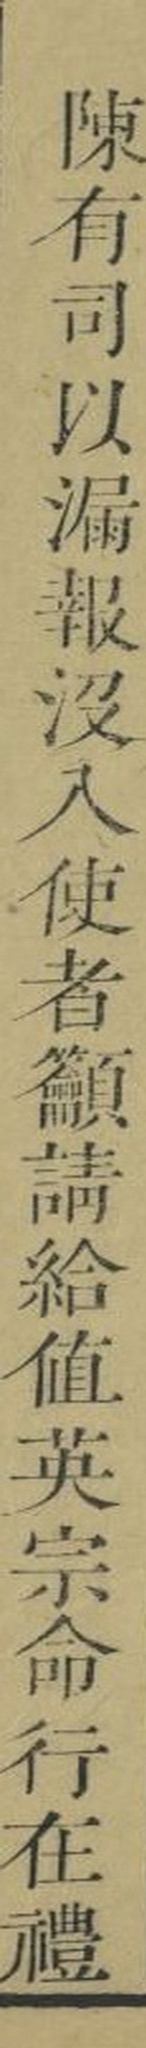陳有司以漏報没入使者籲請給値英宗命行在礼
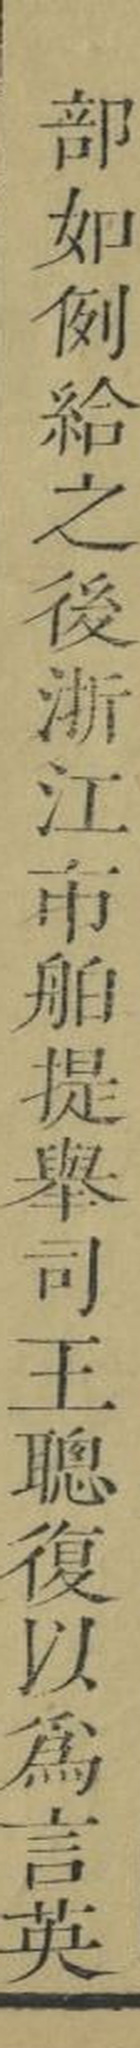部如例給之後浙江市舶提挙司王聡復以為言英
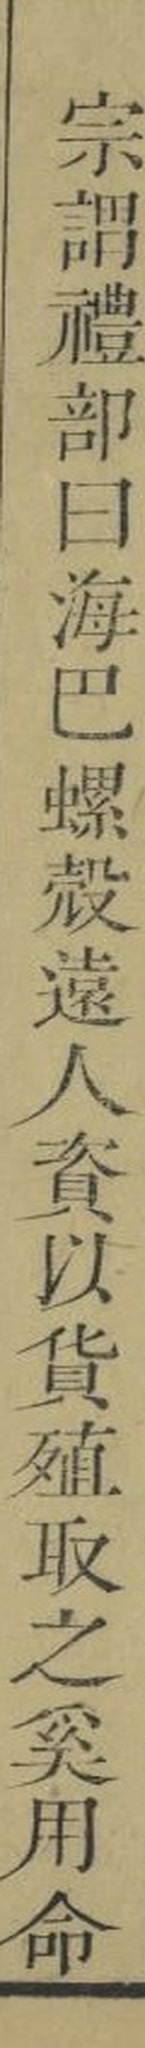宗謂礼部曰海巴螺殻遠人資以貨殖取之奚用命
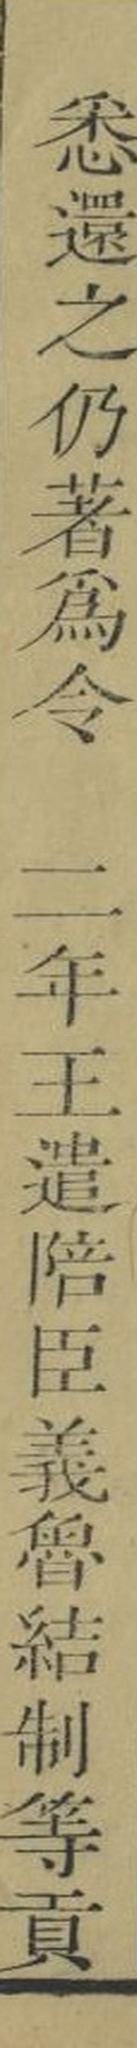悉還之仍著為令二年王遣陪臣義魯結制等貢
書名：中山伝信録 巻三
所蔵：University of the Ryukyus Library
